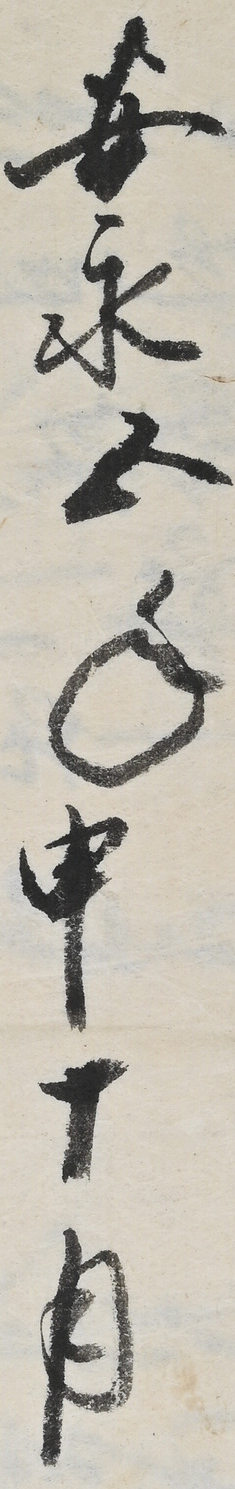安永五年申十月
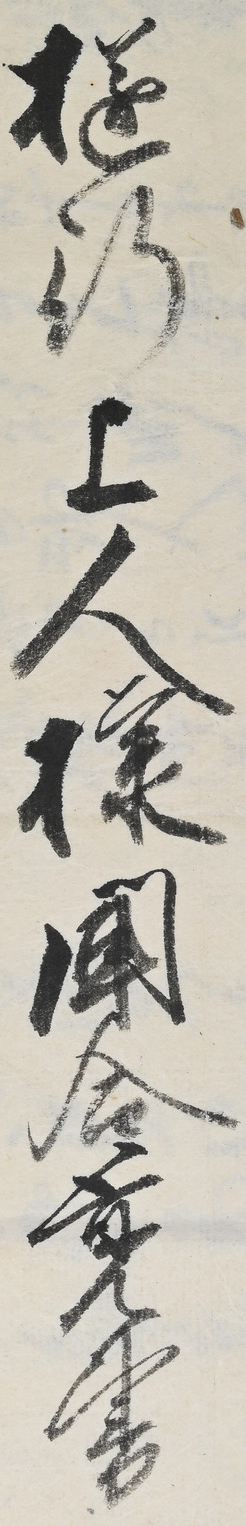遊行上人様聞合覚書
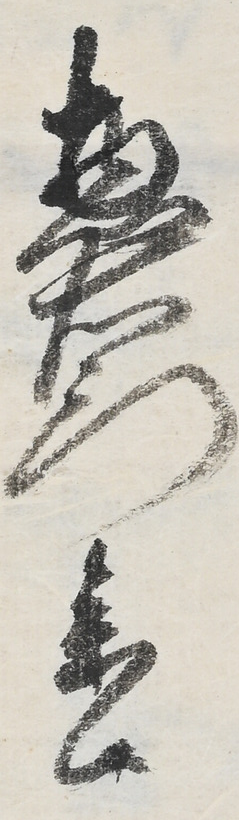惣右衛門参候
